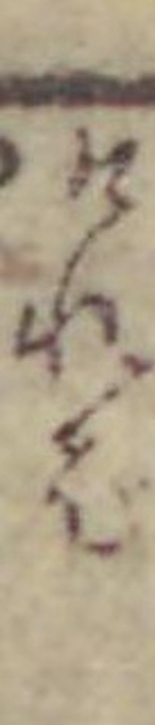ければ
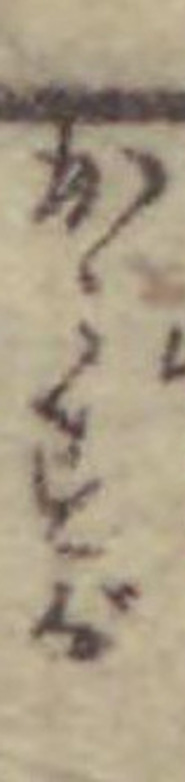からすが
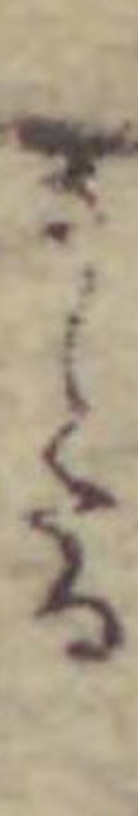さしたる
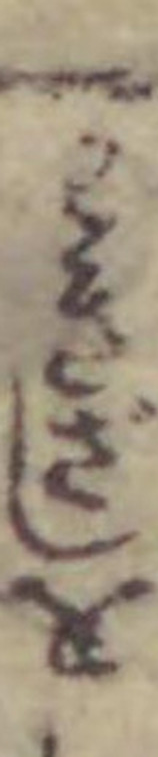わきざしを
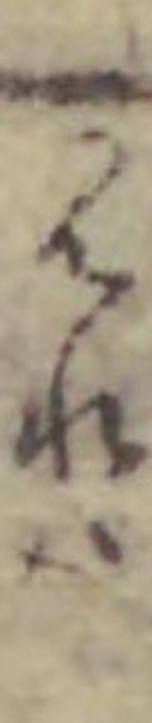見れバ
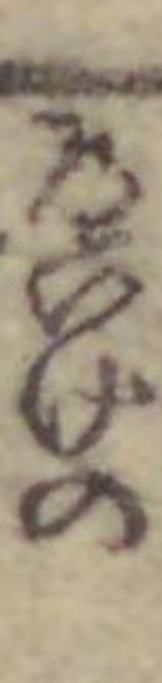へいけの
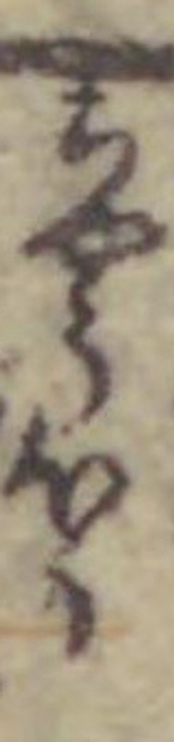ちょうほう
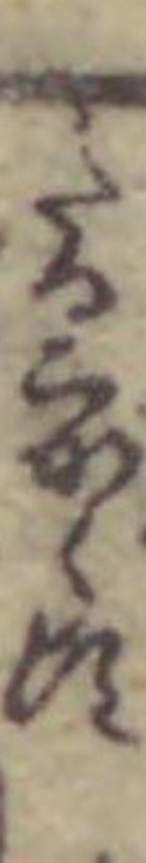たるこがらす
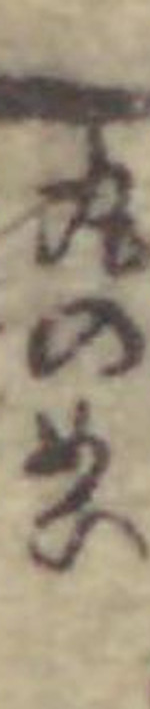丸のめい
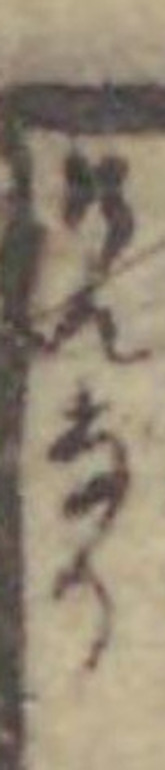けんなり
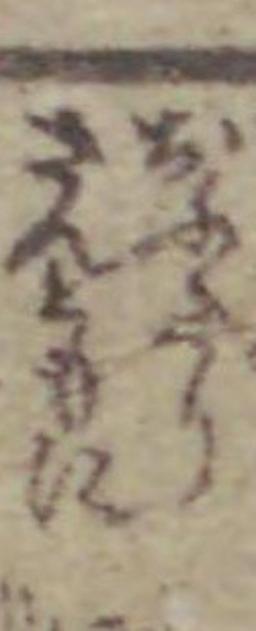さんともに
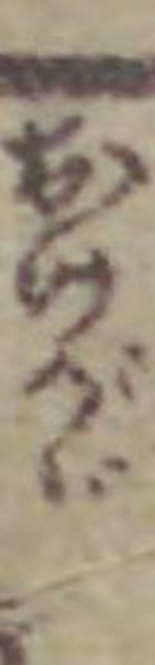おけがゞ
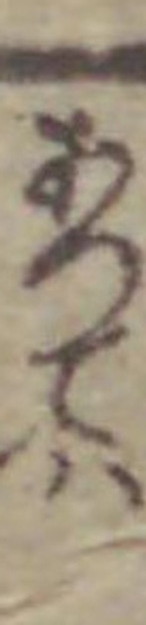あつてハ
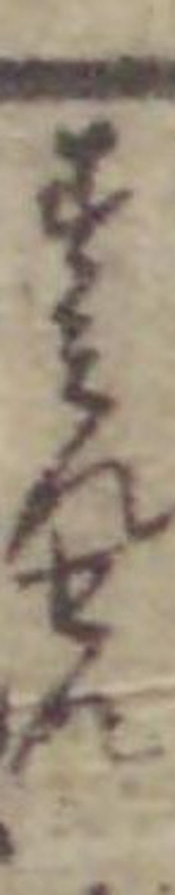すミんせん
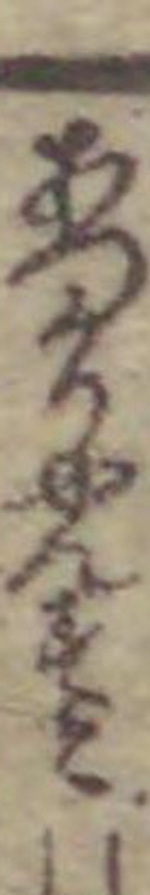あつかりやんすと
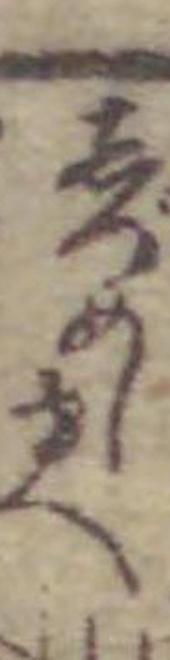しづめしゆへ
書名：烏行水諺草 3巻
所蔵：国立国会図書館 National Diet Library, JAPAN
